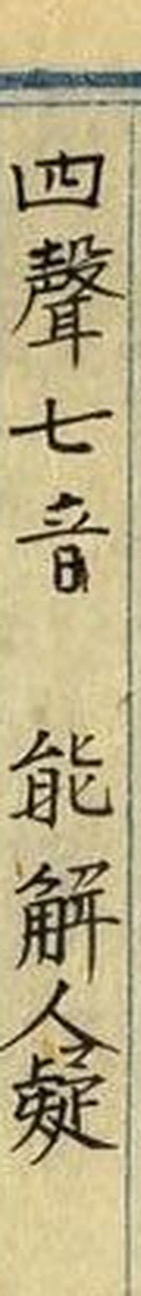四聲七音能解人疑
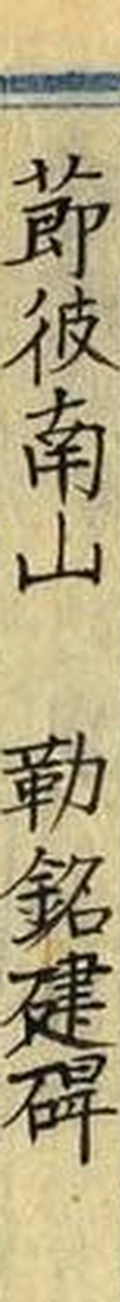莭彼南山勒銘建碑
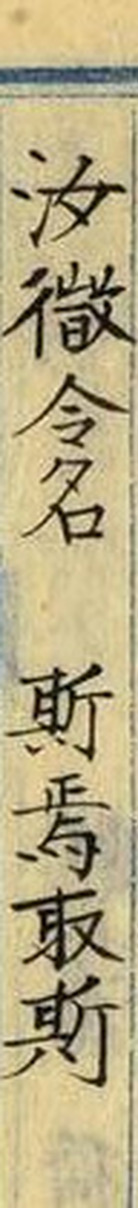汝徴令名斯焉取斯

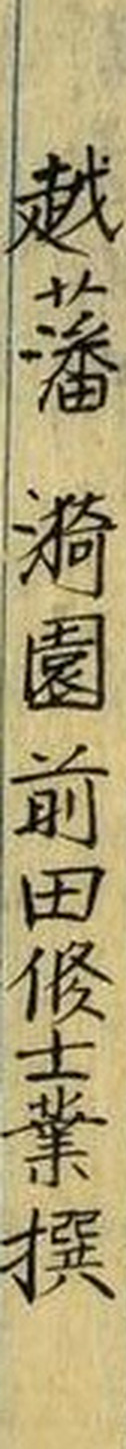越藩漪園前田修士業撰
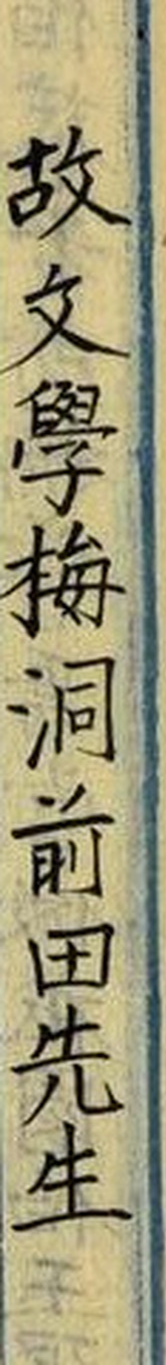故文學梅洞前田先生
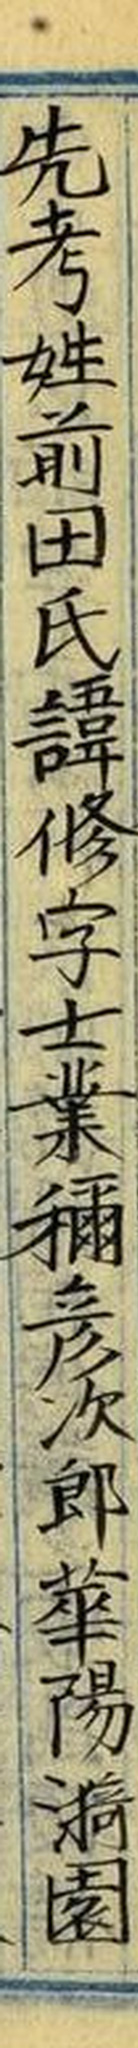先考姓前田氏諱修字士業穪彦次郎蕐陽漪園
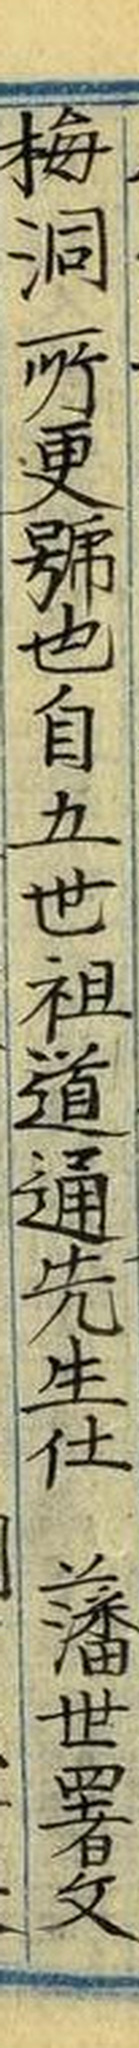梅洞所更號也自五世祖道通先生仕藩世署文
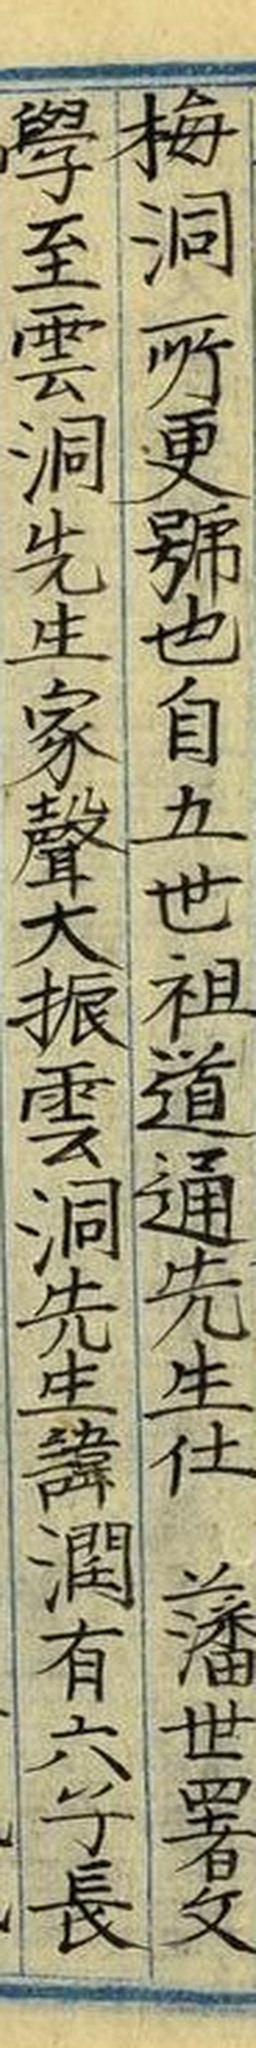學至雲洞先生家聲大振雲洞先生諱潤有六子長
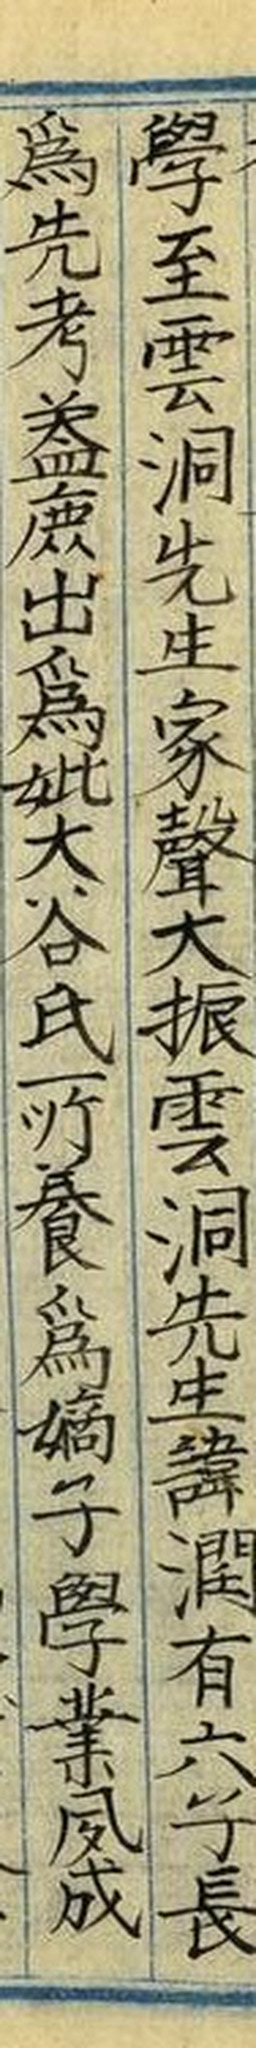爲先考葢庻出爲妣大谷氏所養爲嫡子學業夙成
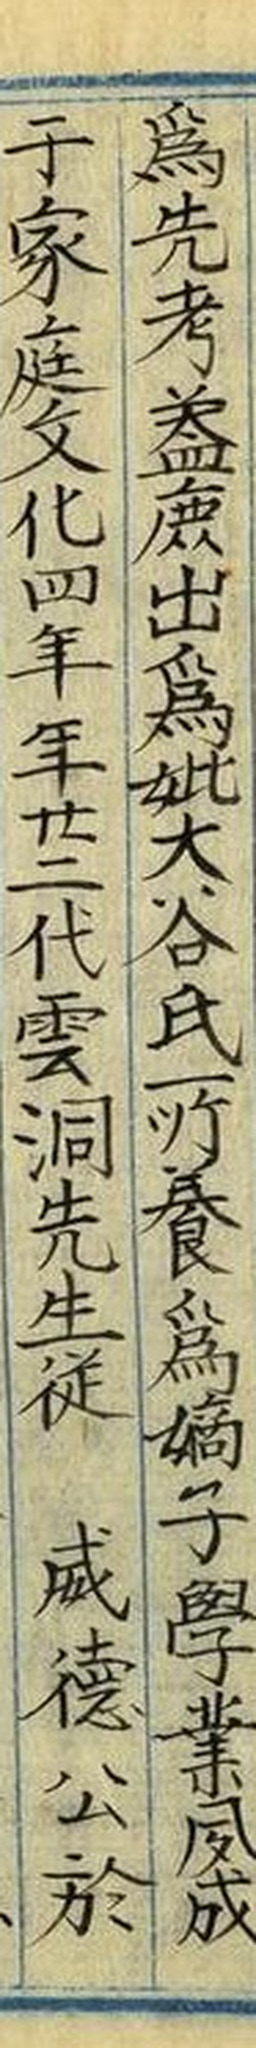于家庭文化四年年廿二代雲洞先生従威德公於
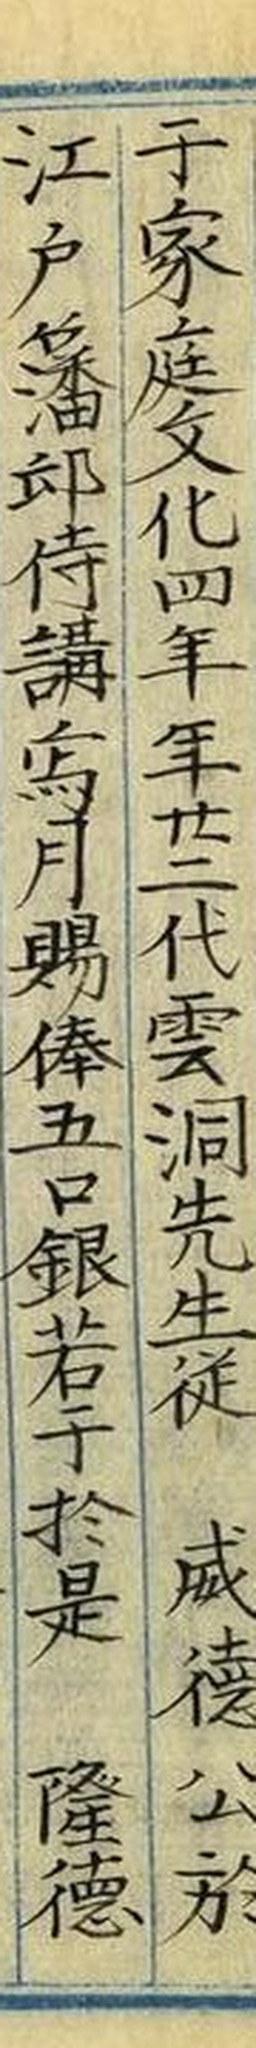江戸藩邸侍講焉月賜俸五口銀若干扵是隆德
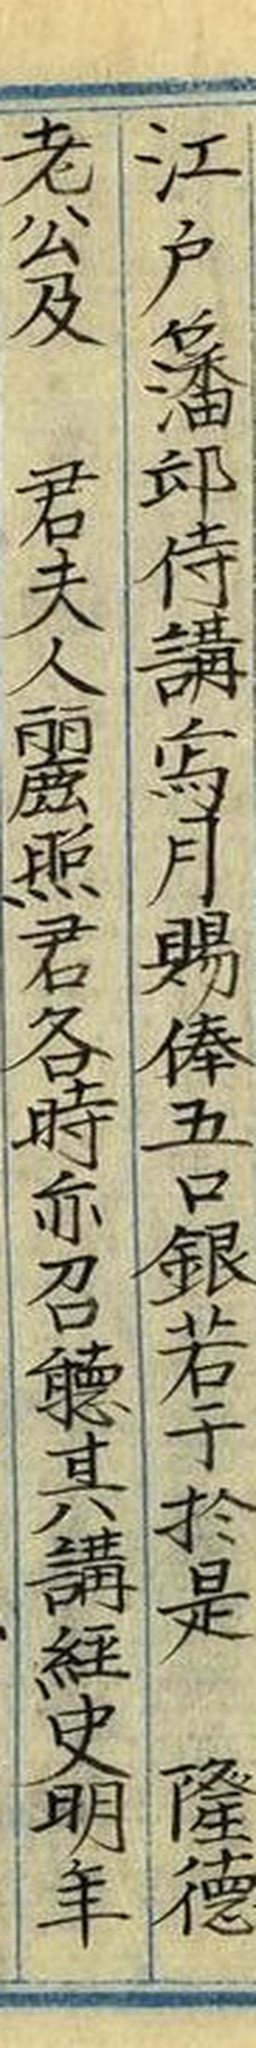老公及君婦人麗照君各時亦召聽其講經史明年
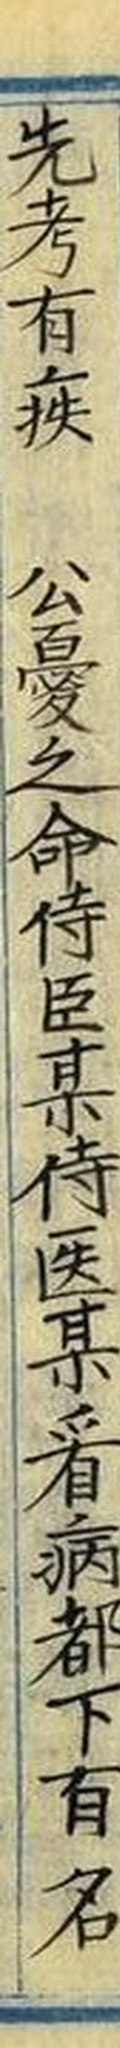先考有疾公憂之命侍臣某侍医某看病都下有名
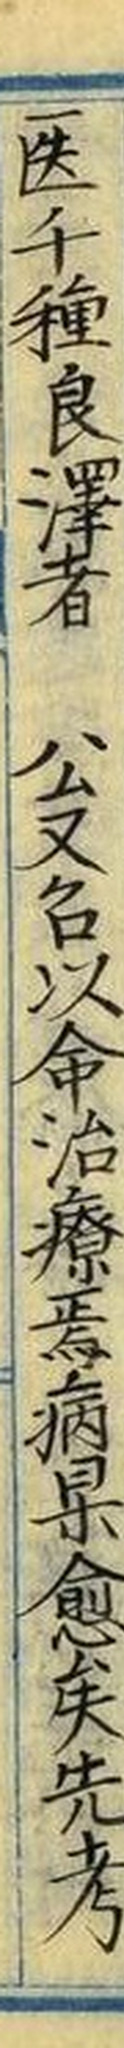医千種良澤者公又召以𠇭治療焉病杲愈矣先考

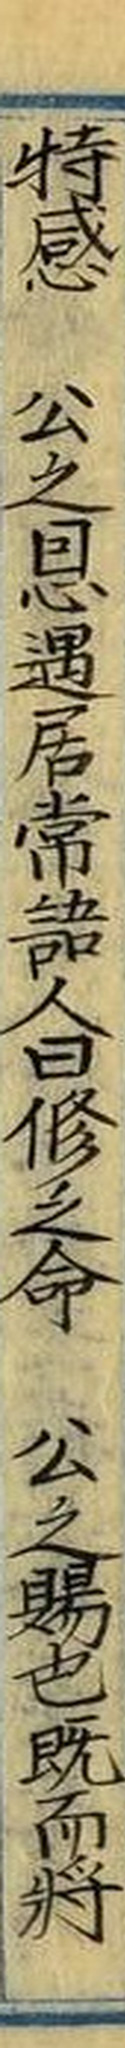特感公之恩遇居常語人曰修之命公之賜也既而將
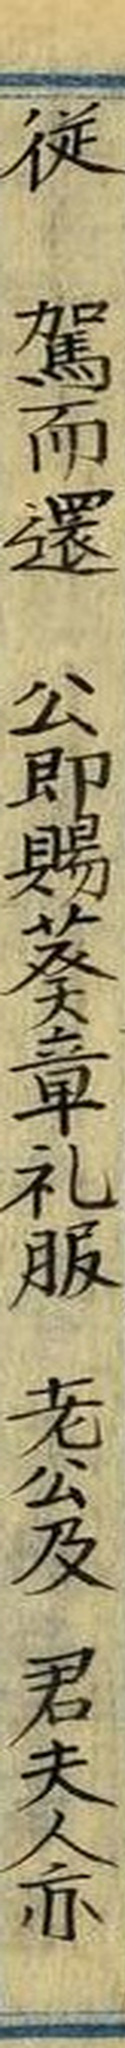従駕而還公即賜葵章礼服老公及君夫人亦
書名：温古集 四巻
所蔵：福井県文書館 Fukui Prefectural Archives
